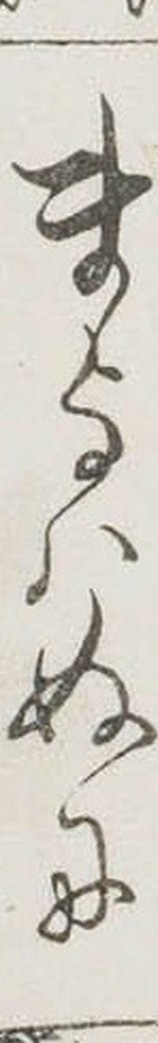まよはぬに
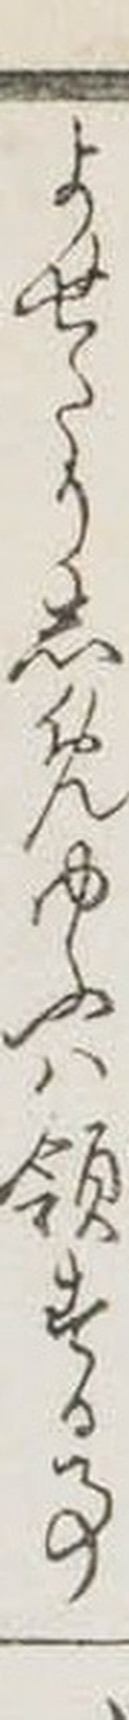よせたりしめゆふは領する事
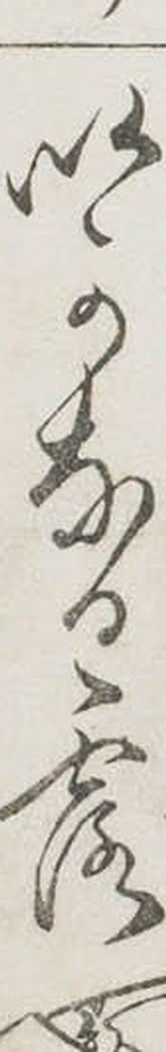いかなる露
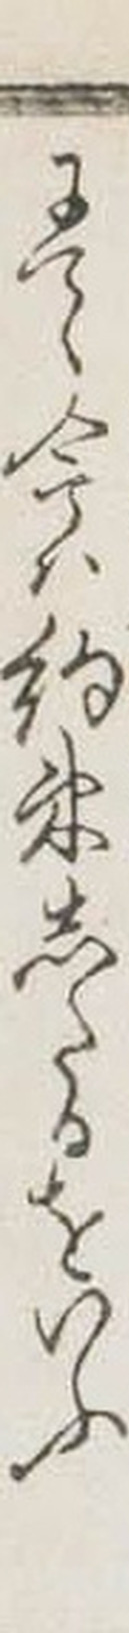にて今は約束したるをいふ
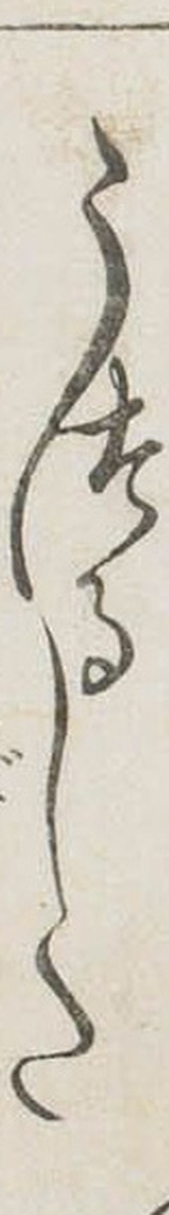うつるした

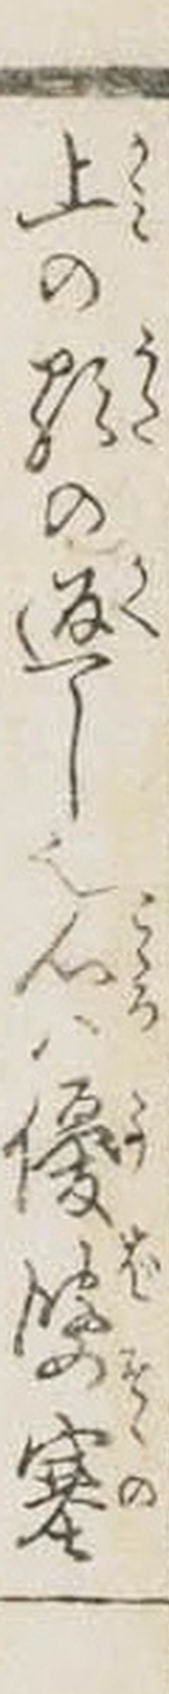上の歌の返し也心は優婆塞
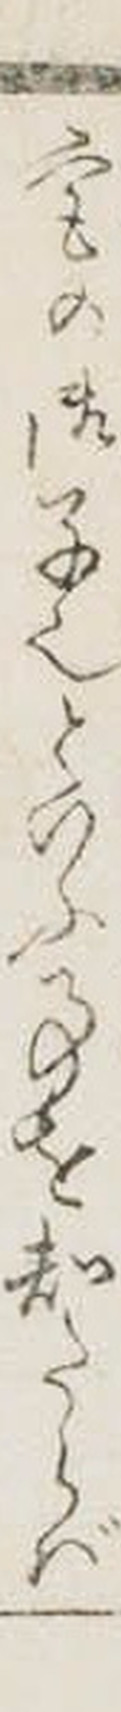宮の御子也といふ事を知たらば
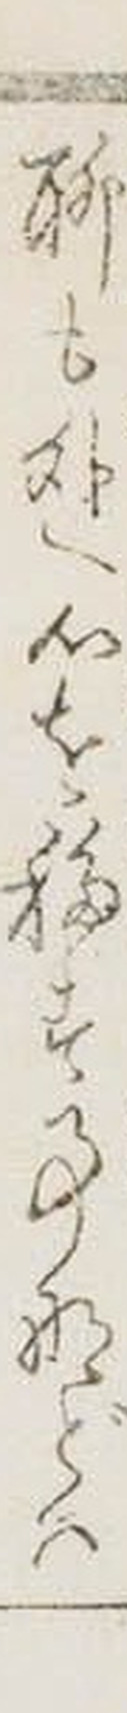聊も外へ心を移す事などは
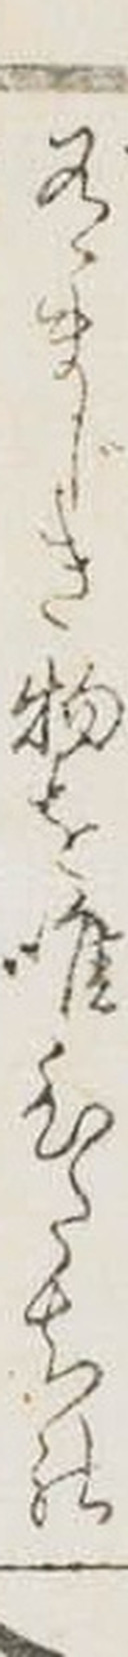有まじき物を唯ひたちの
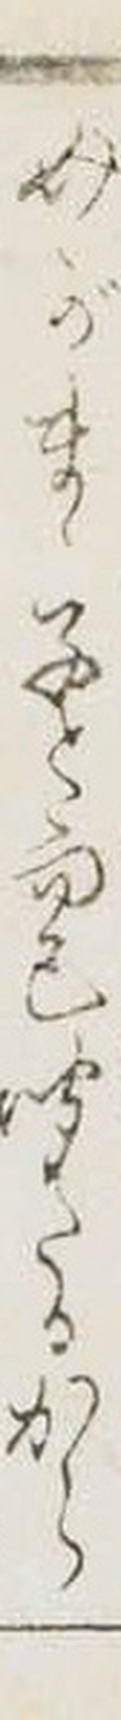介がまゝ子と而已聞たるから
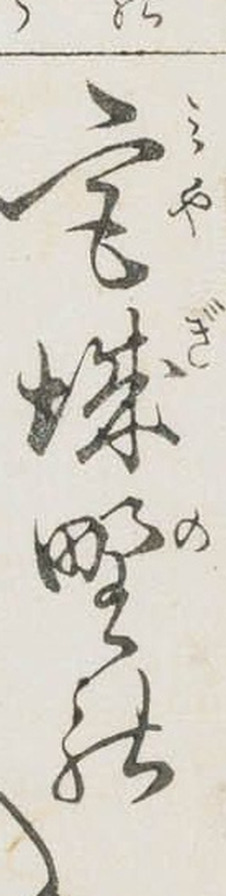宮城野の
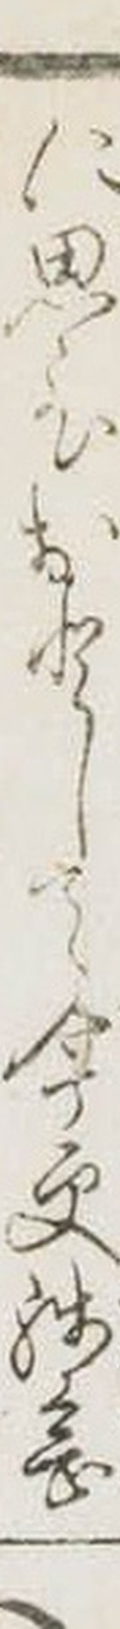に思ひおとして今更残念
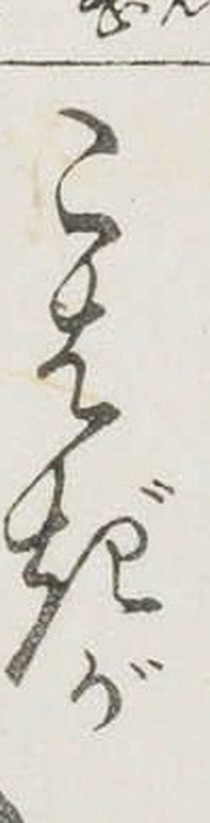こはぎが
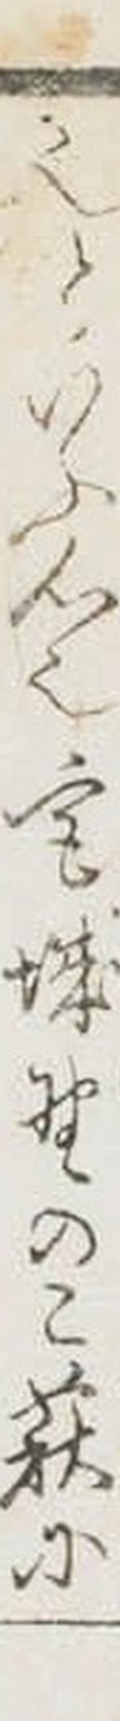也といふ心也宮城野のこ萩に
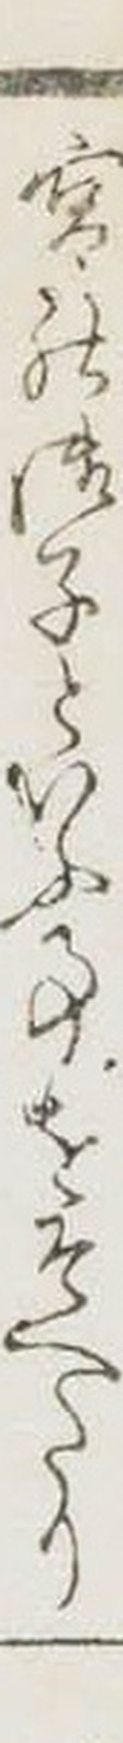宮の御子といふ事をそへたり
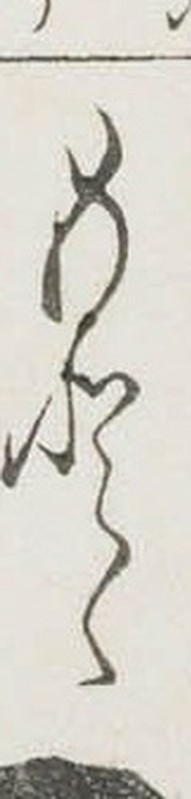もとゝ
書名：源氏百人一首
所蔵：東京学芸大学教育コンテンツアーカイブ
